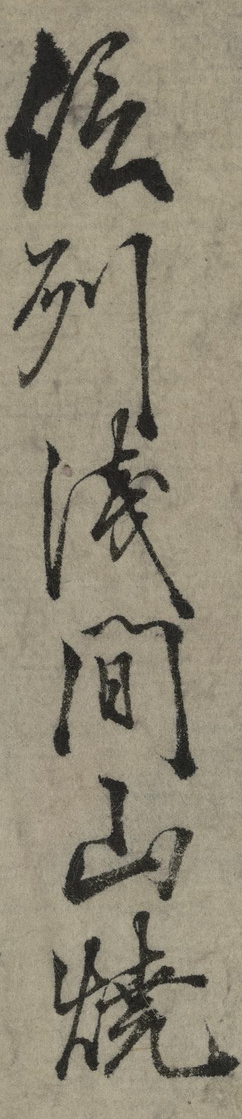信州浅間山焼

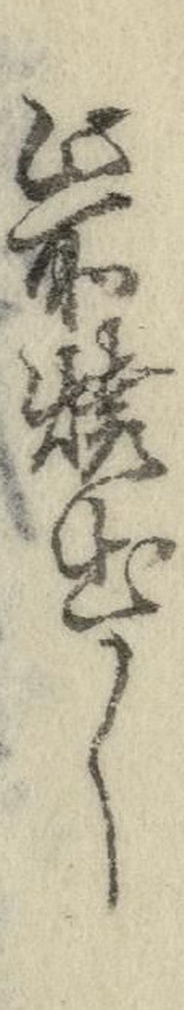此所焼出し
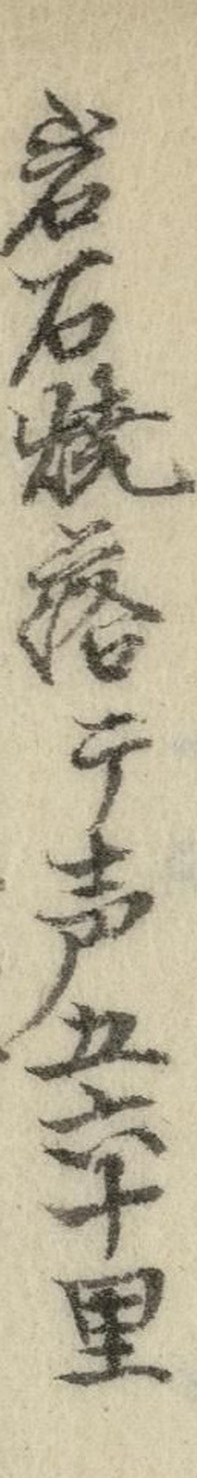岩石焼落テ声五六十里
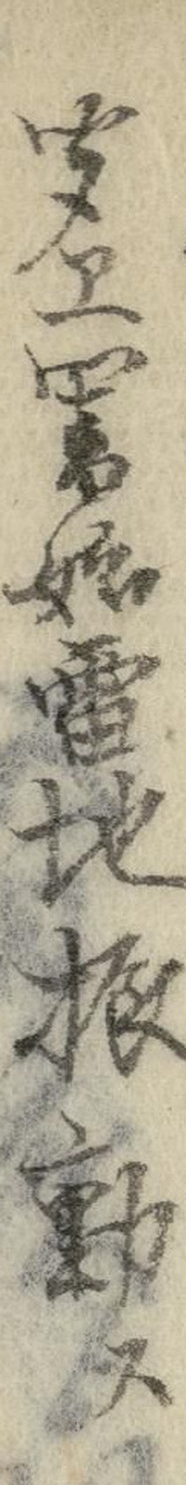聞え響始雷地振動ス
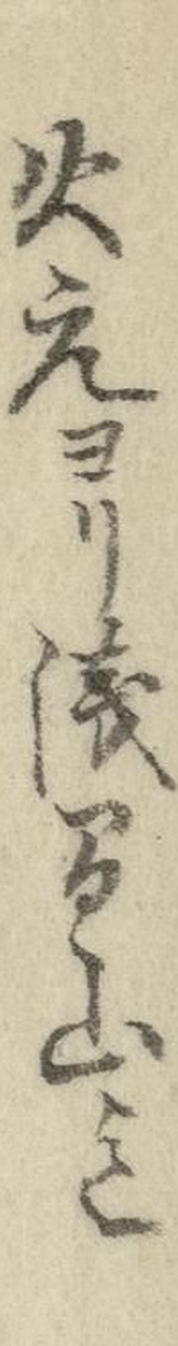火元ヨリ浅間山迄
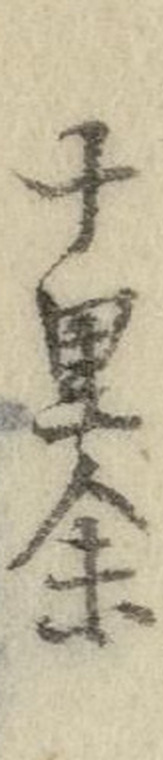十里余
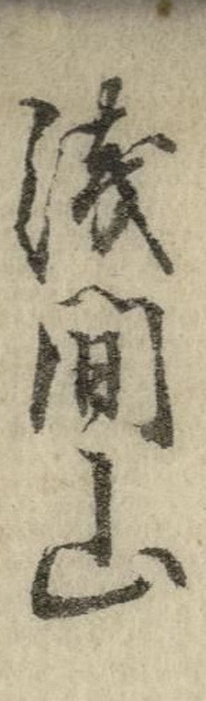浅間山
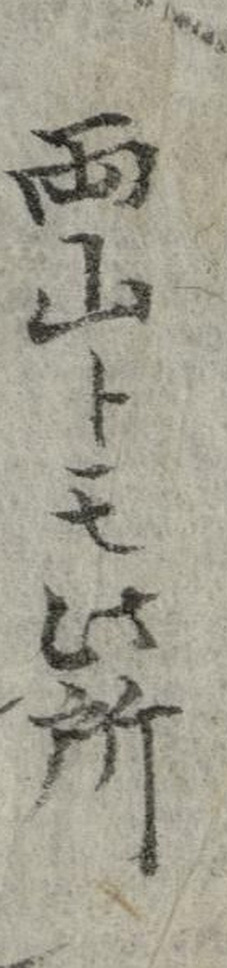両山トモ此所
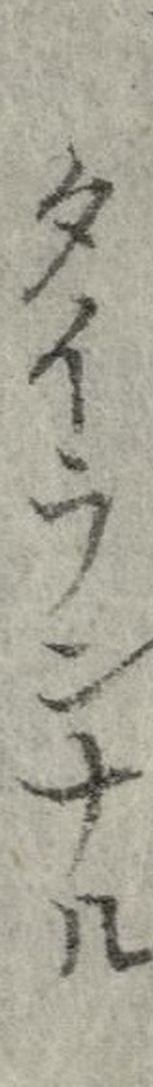タイラ二ナル
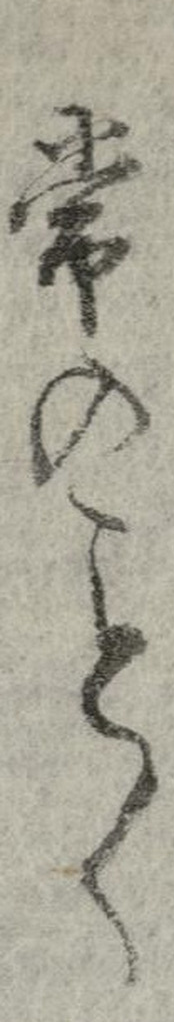常のことく

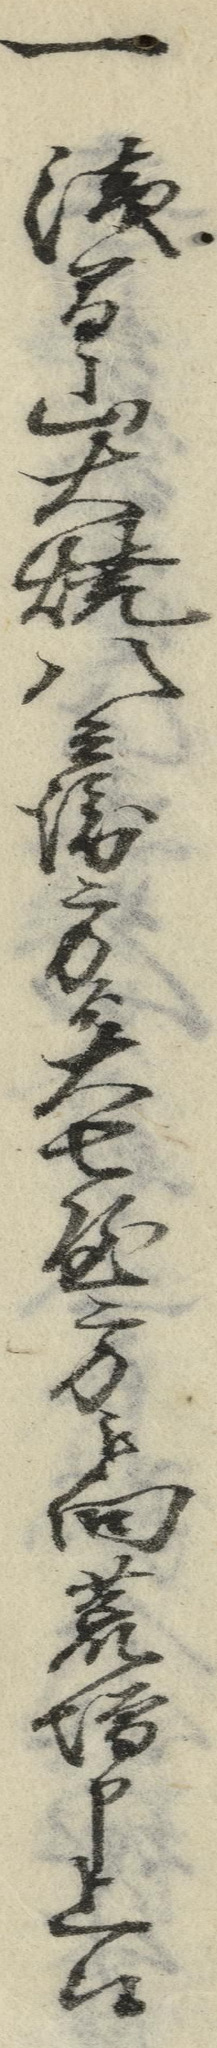一浅間山大焼八兵衛方ゟ大七屋方江向荒増申上候
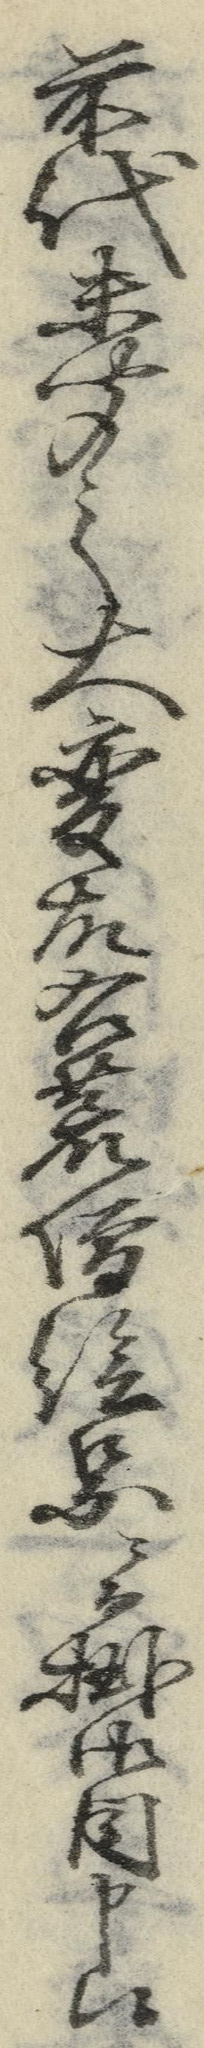前代未聞之大変故右荒増絵図ニ而掛御目申候
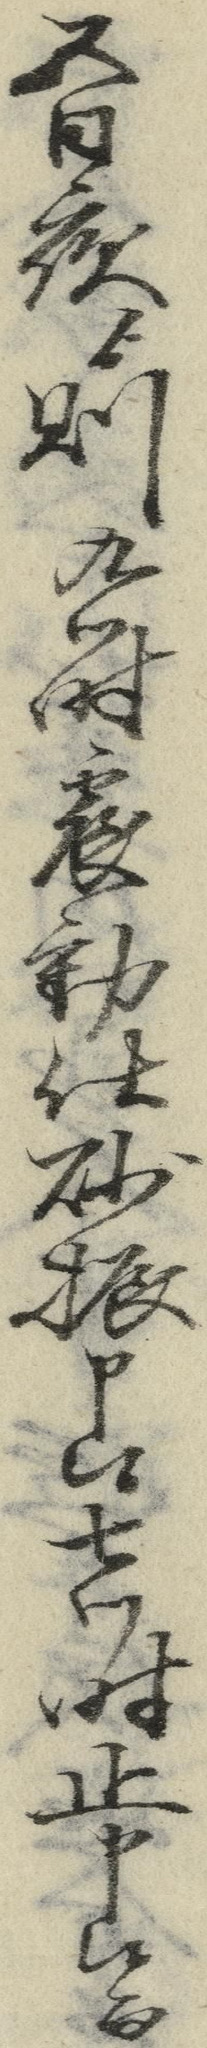五日夜ゟ即九ッ時震動仕砂振申候七ッ時止申候而
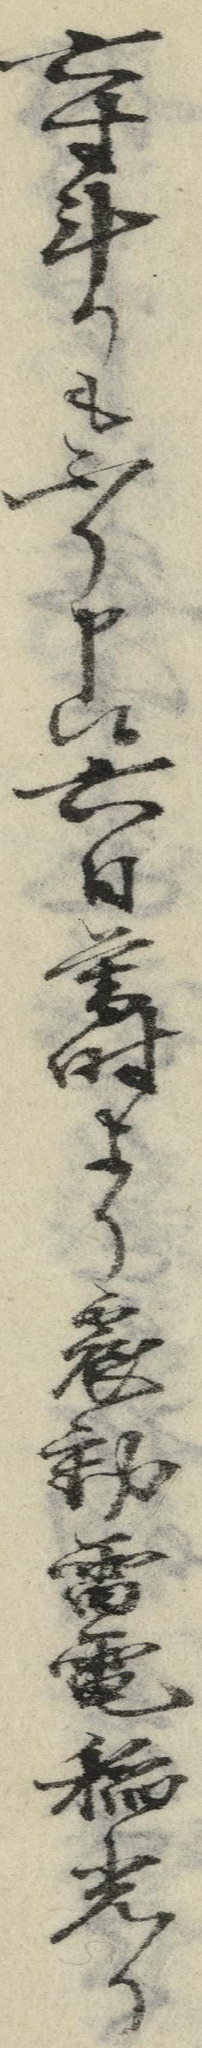六寸斗りもふり申候六日暮時より震動雷電稲光り
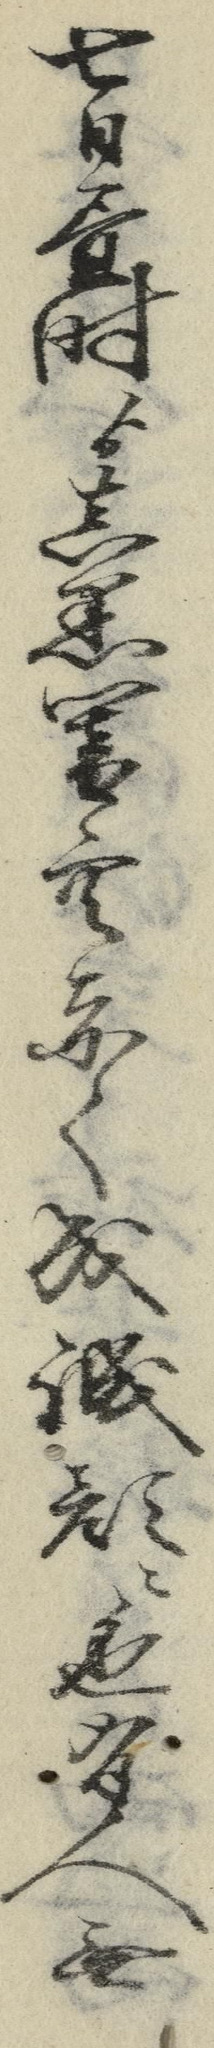七日昼時ゟ真黒闇空赤く成誠顔ニ色有人無
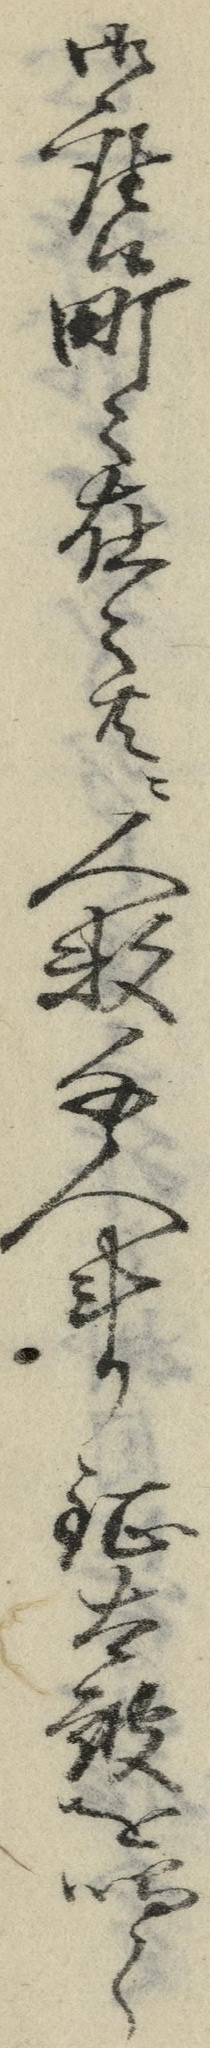御座候町々在々共ニ人数千人斗り鉦太鼓を鳴し
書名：信州浅間山焼
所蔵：東京大学地震研究所図書室 Earthquake Research Institute Library, The University of Tokyo, JAPAN
